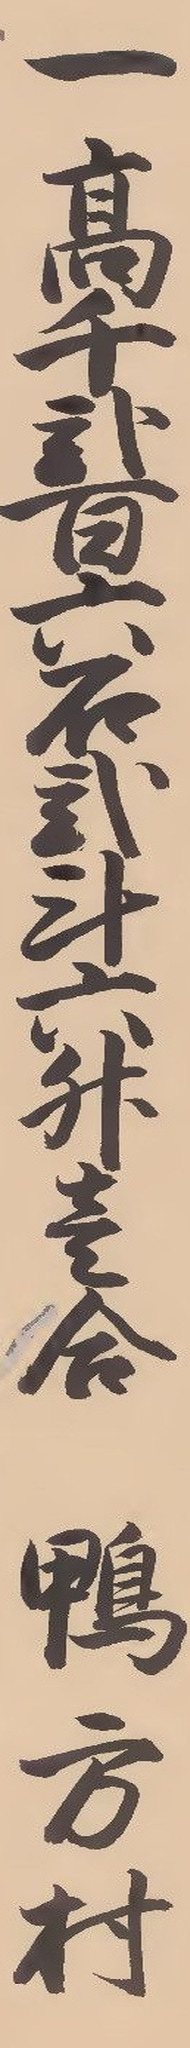一高千弐百六石弐斗六升壱合鴨方村
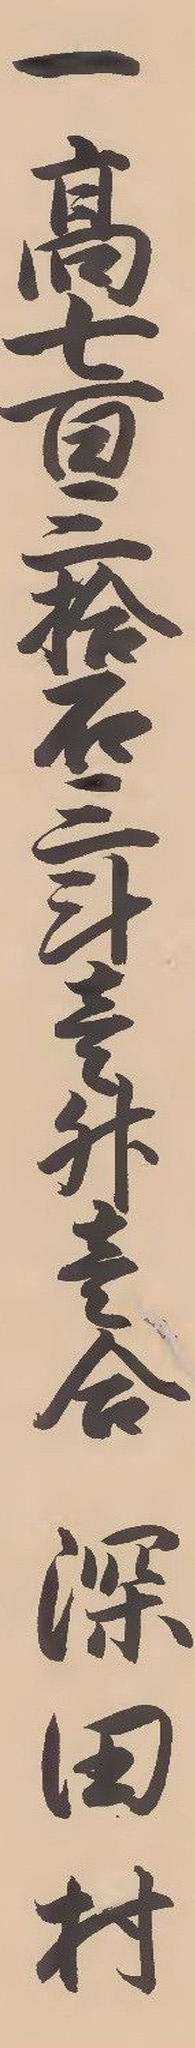一高七百三拾石三斗壱升壱合深田村
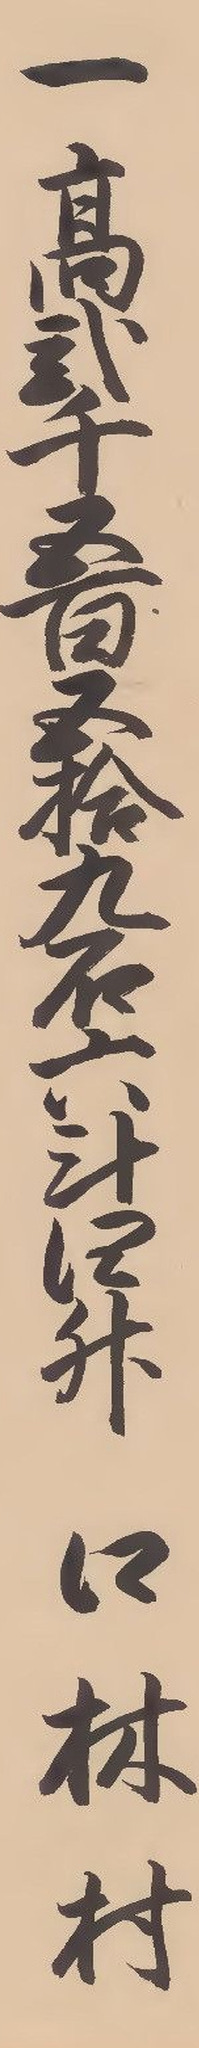一高弐千五百五拾九石六斗四升口林村
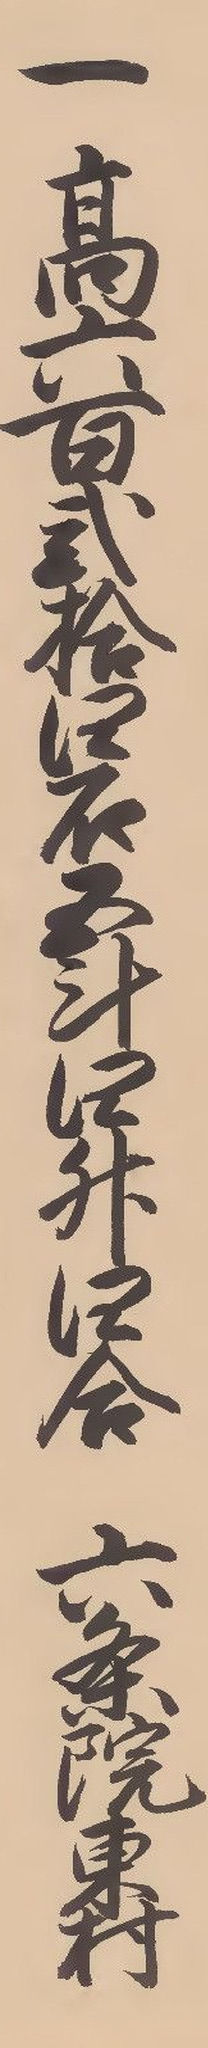一高六百弐拾四石五斗四升四合六条院東村
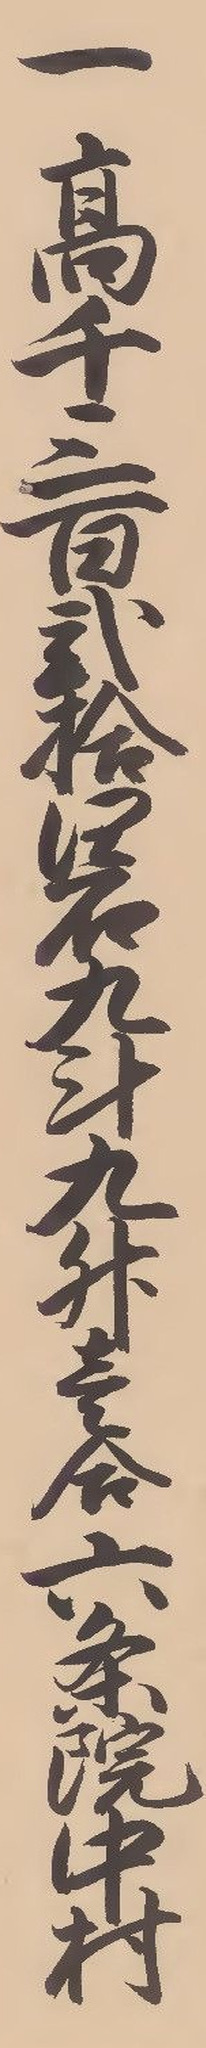一高千三百弐拾四石九斗九升壱合六条院中村

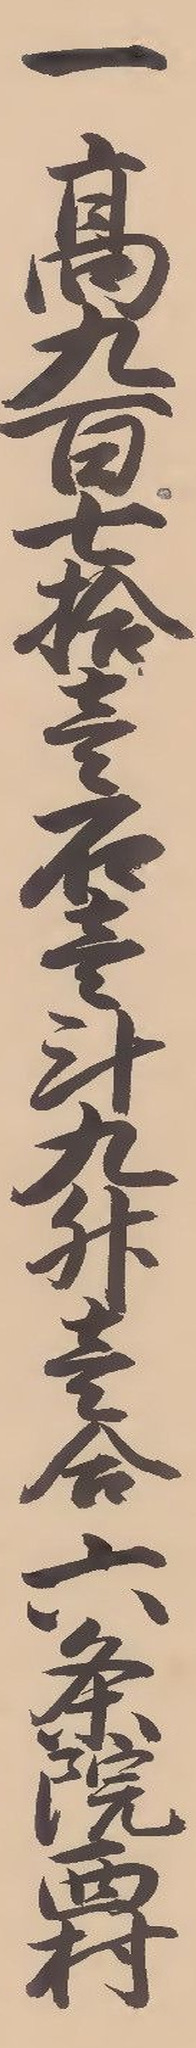一高九百七拾壱石壱斗九升壱合六条院西村
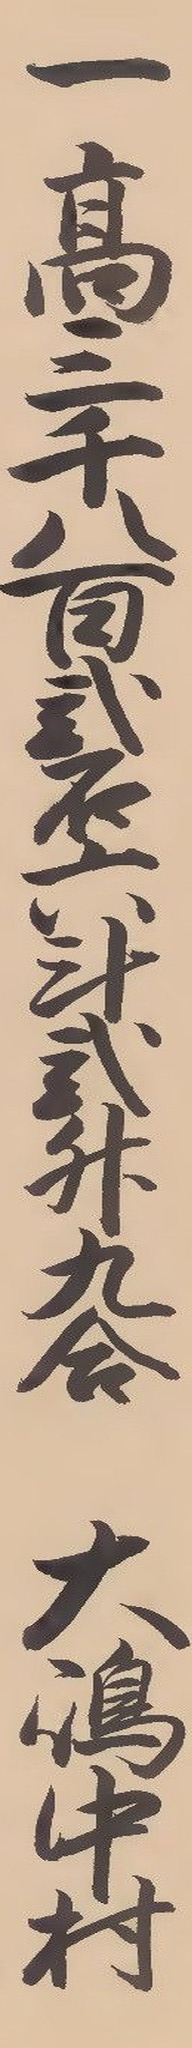一高三千八百弐石六斗弐升九合大島中村
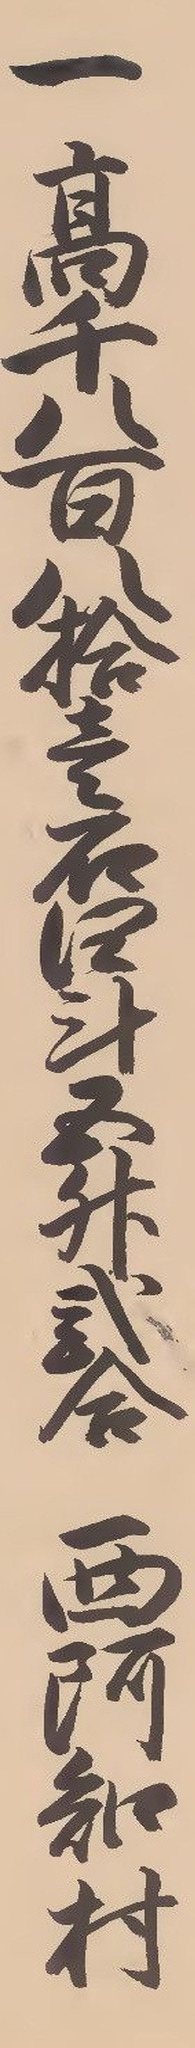一高千八百八拾壱石四斗五升弐合西阿知村
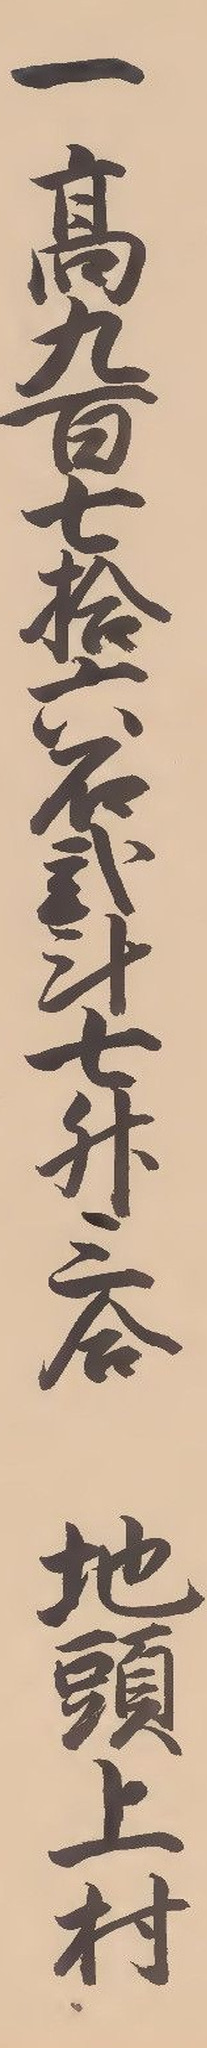一高九百七拾六石弐斗七升三合地頭上村
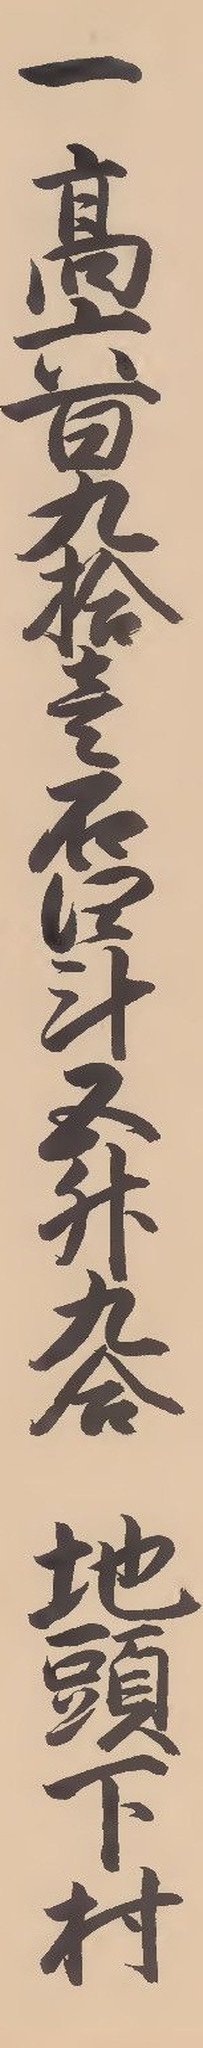一高六百九拾壱石四斗五升九合地頭下村
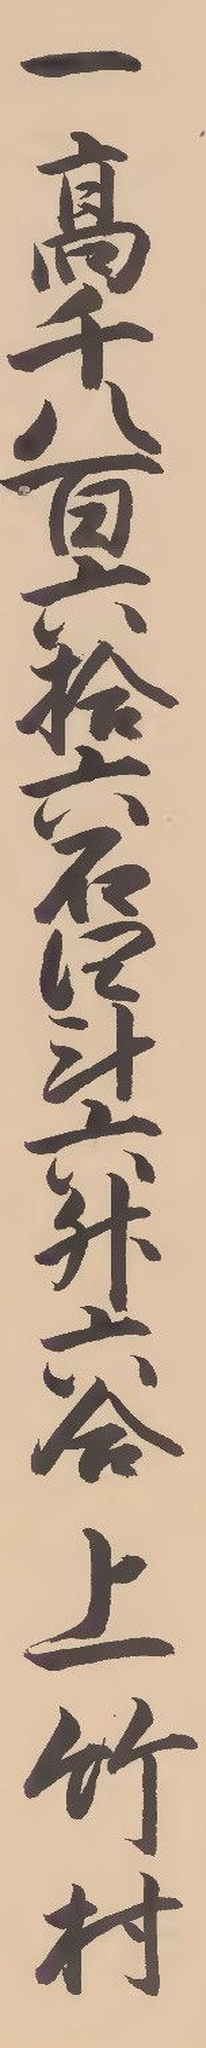一高千八百六拾六石四斗六升六合上竹村

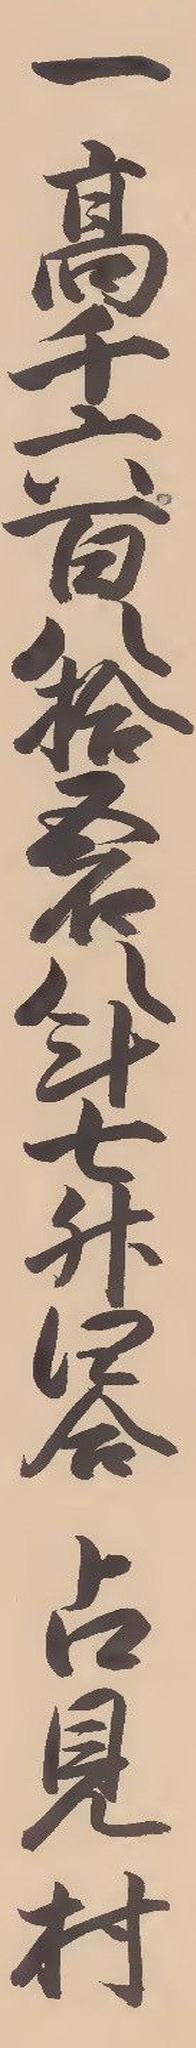一高千六百八拾五石八斗七升四合占見村
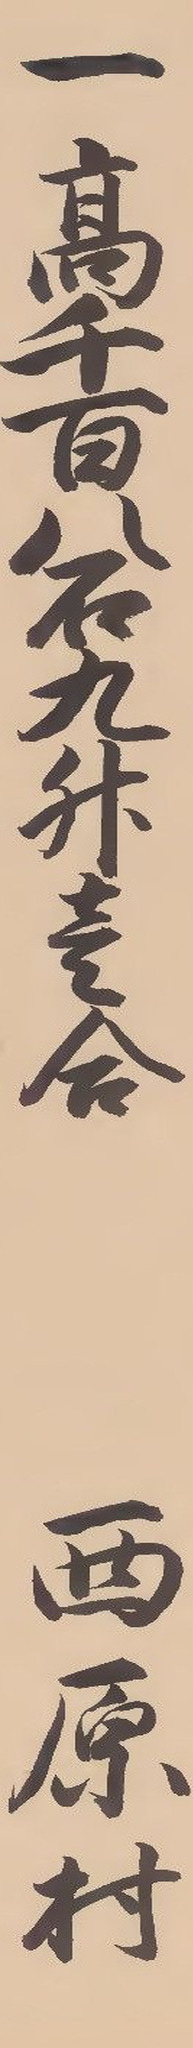一高千百八石九升壱合西原村
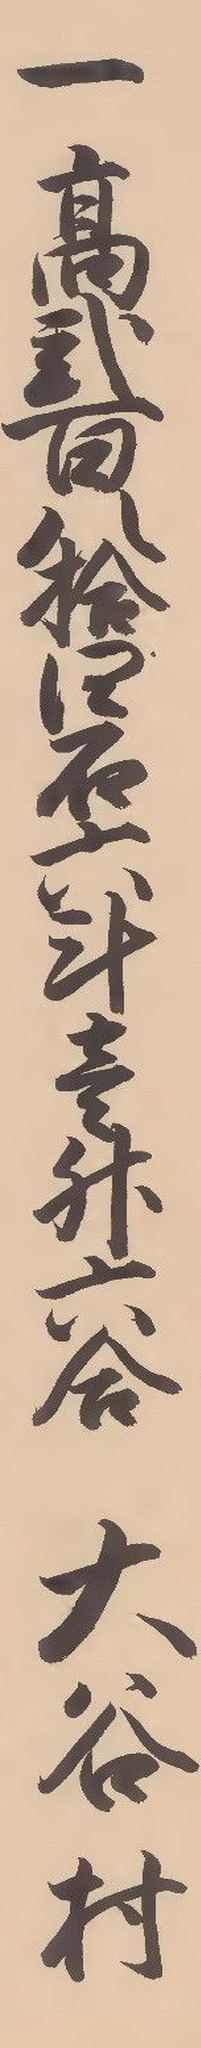一高弐百八拾四石六斗壱升六合大谷村
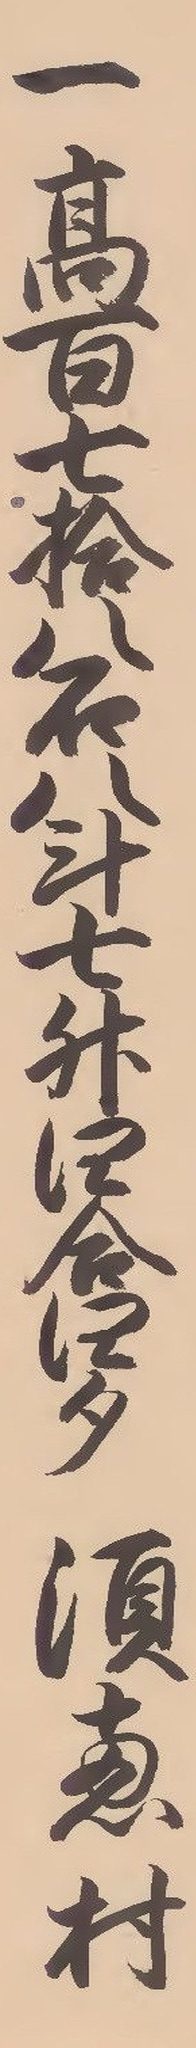一高百七拾八石八斗七升四合四勺須恵村

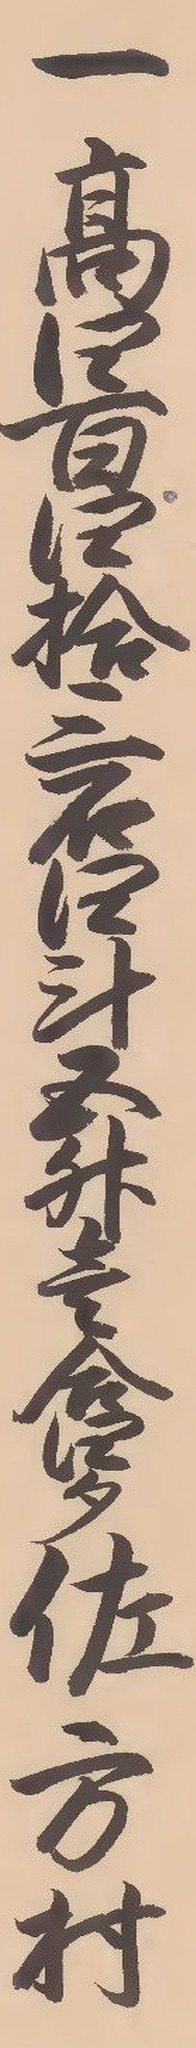一高四百四拾三石四斗五升壱合四勺佐方村
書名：備中国郷帳
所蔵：国立公文書館 National Archives of Japan
